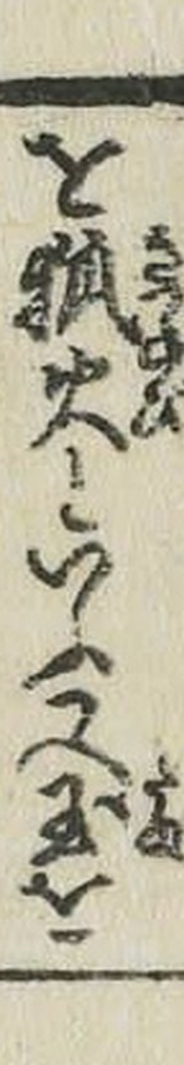を狐火といふ又玉を
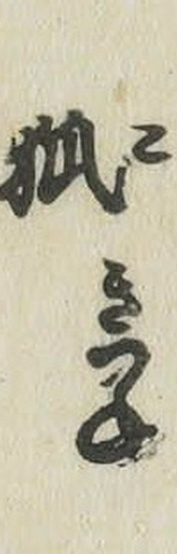狐きつね
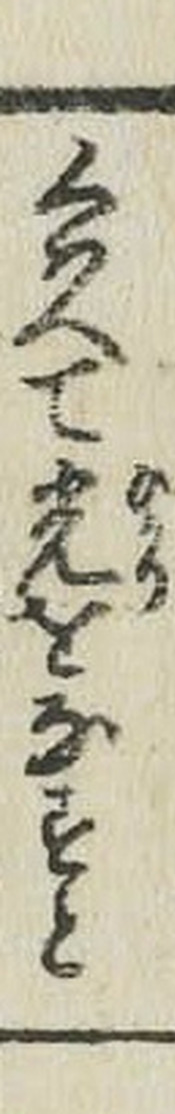くはへて光をなすと
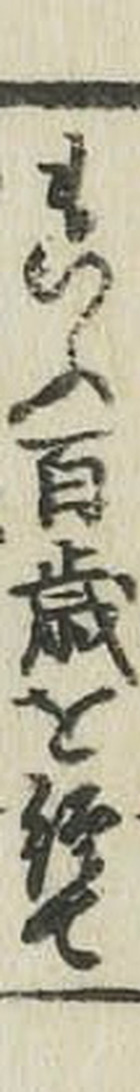もいふ百歳を経て
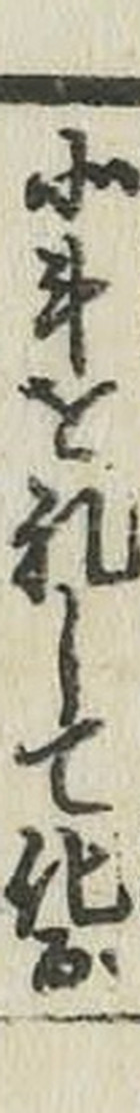北斗を礼して化る
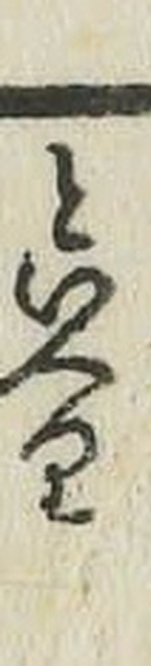といへり
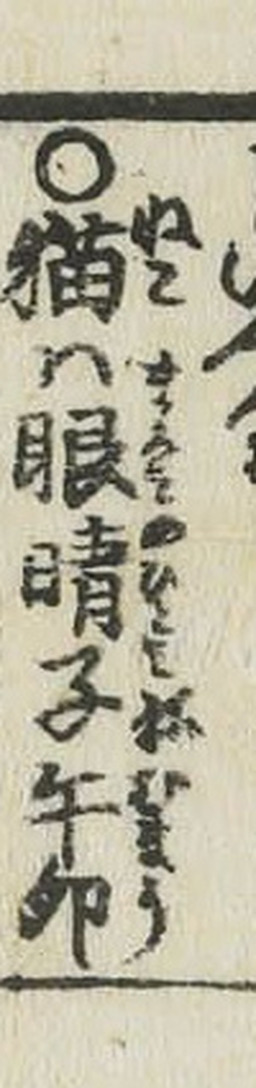○猫は眼晴子午卯
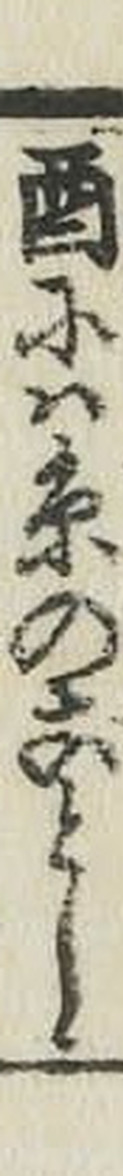酉には糸のごとし
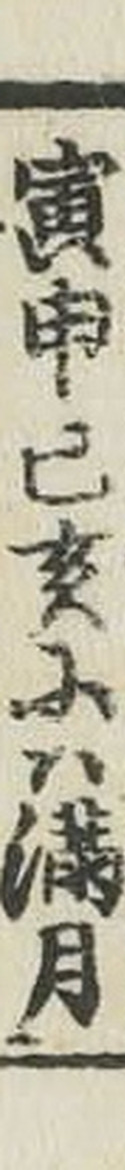寅申巳亥には満月
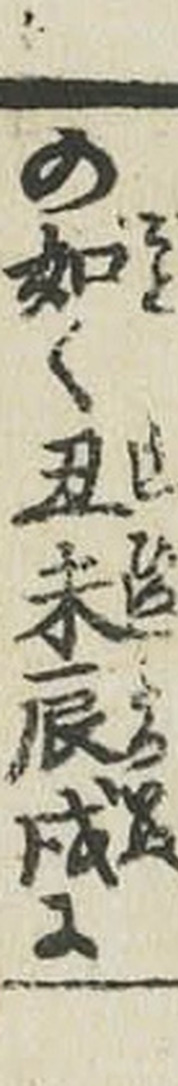の如く丑未辰戌に
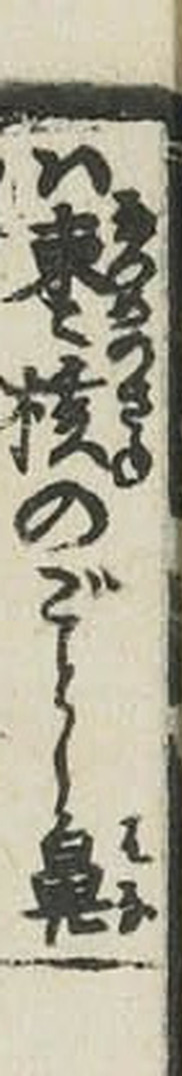は棗核のごとし鼻
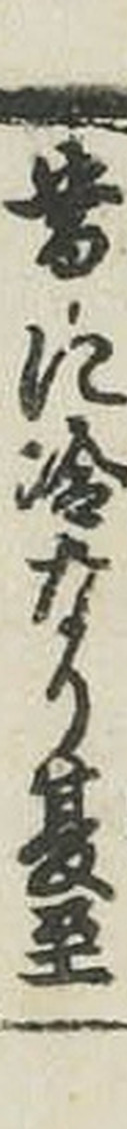常に冷なり夏至
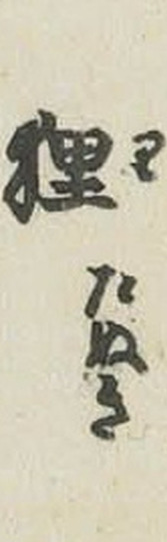狸たぬき
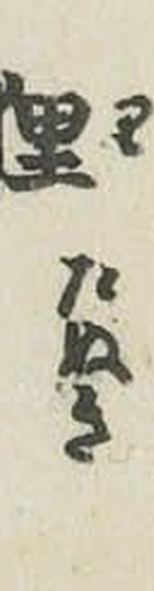狸たぬき
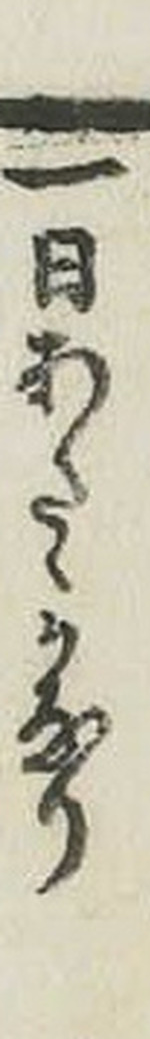一日あたゝかなり
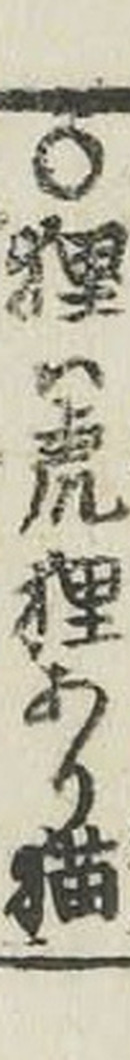○狸は虎狸あり猫
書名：増補頭書訓蒙図彙大成 10巻 6:巻之12-13
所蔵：東京学芸大学教育コンテンツアーカイブ
